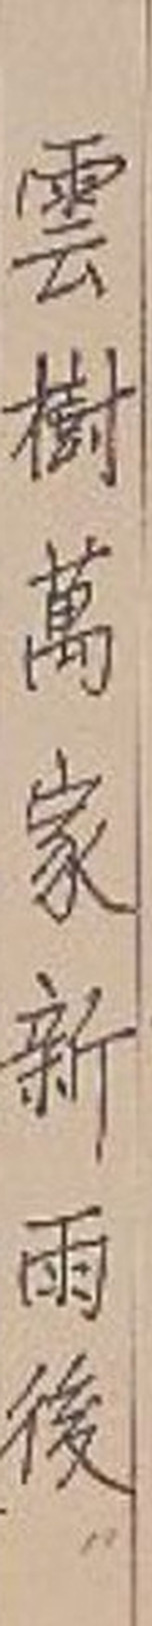八雲樹万家新雨後
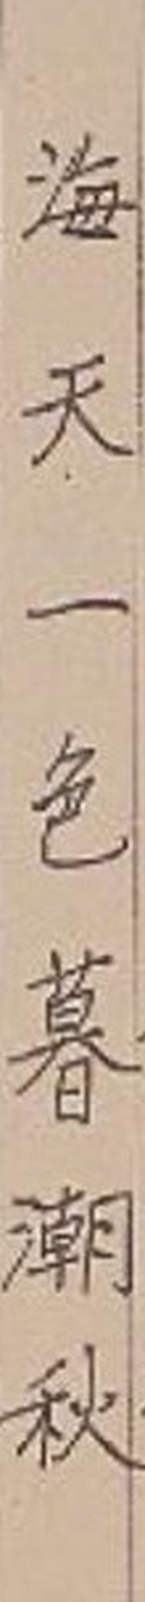度海天一色暮潮秋
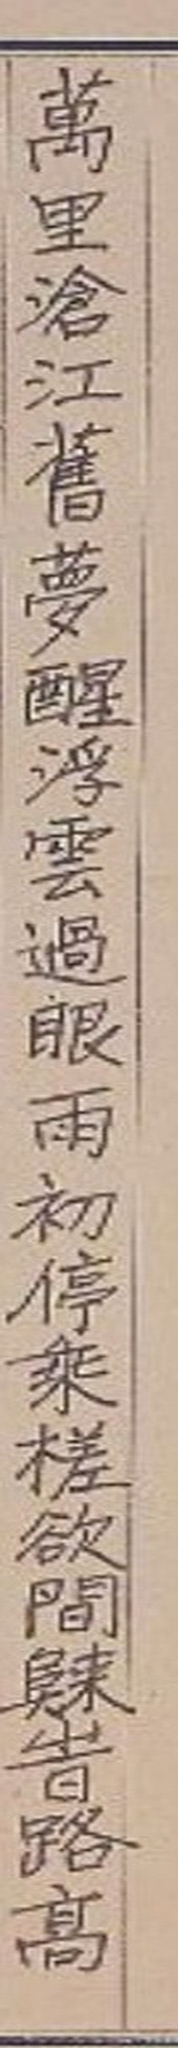万里滄江旧夢醒浮雲過眼雨初停乗槎欲間時路高
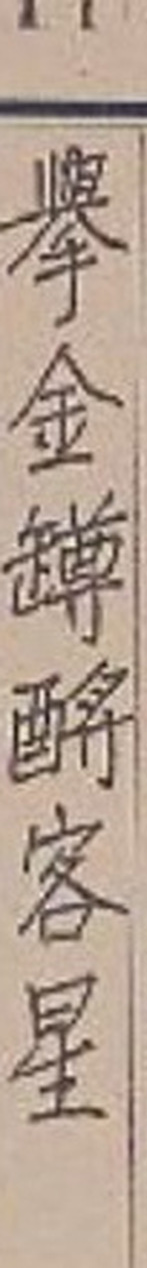挙金樽酹客星
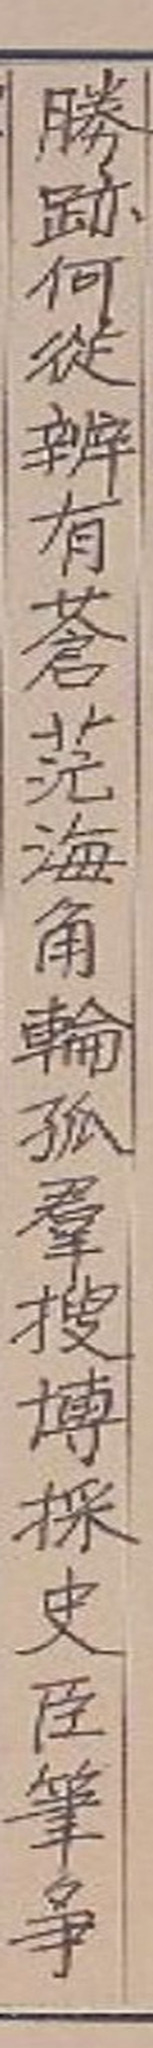勝跡何従弁有蒼茫海角輪孤群捜博採史臣筆争
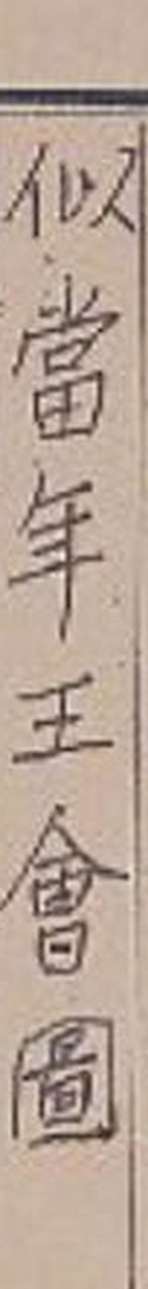似当年王会図
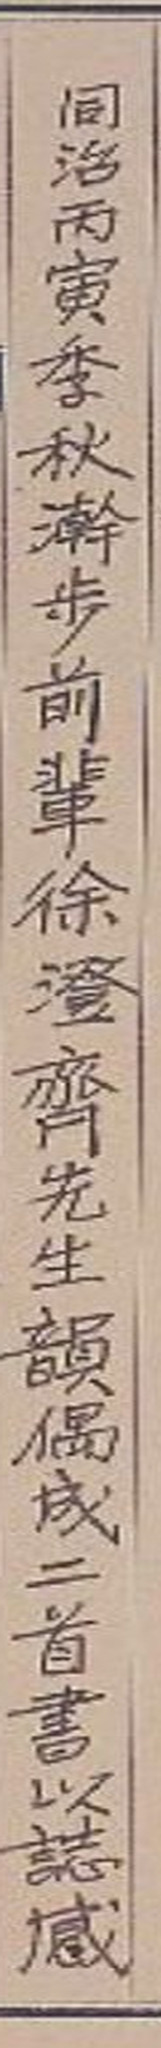同治丙寅季秋澣歩前輩徐澄齊先生韻偶成二首書以誌感

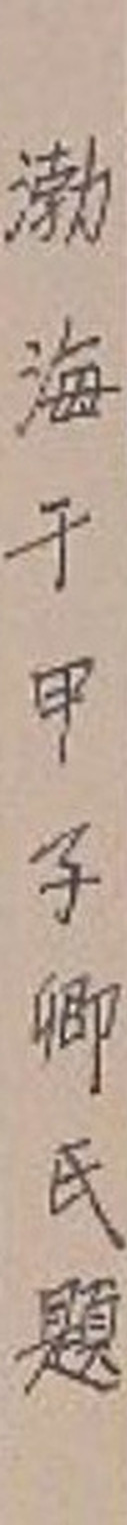渤海于甲子卿氏題
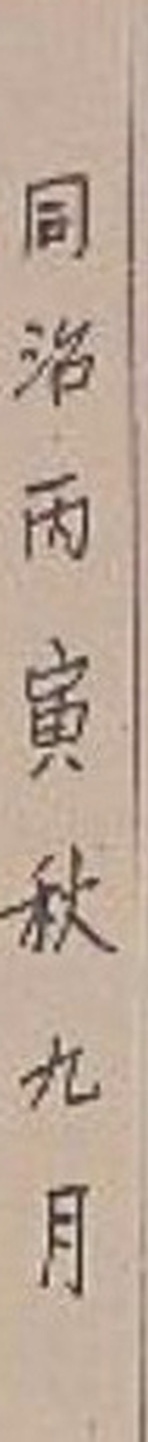同治丙寅秋九月
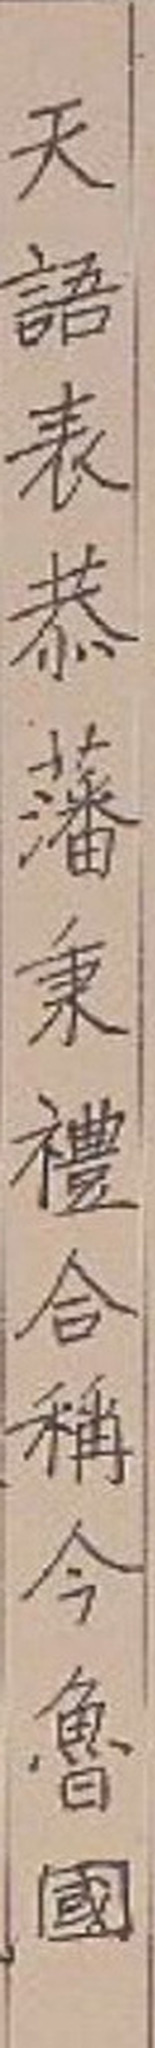天語表恭藩秉礼合称今魯国
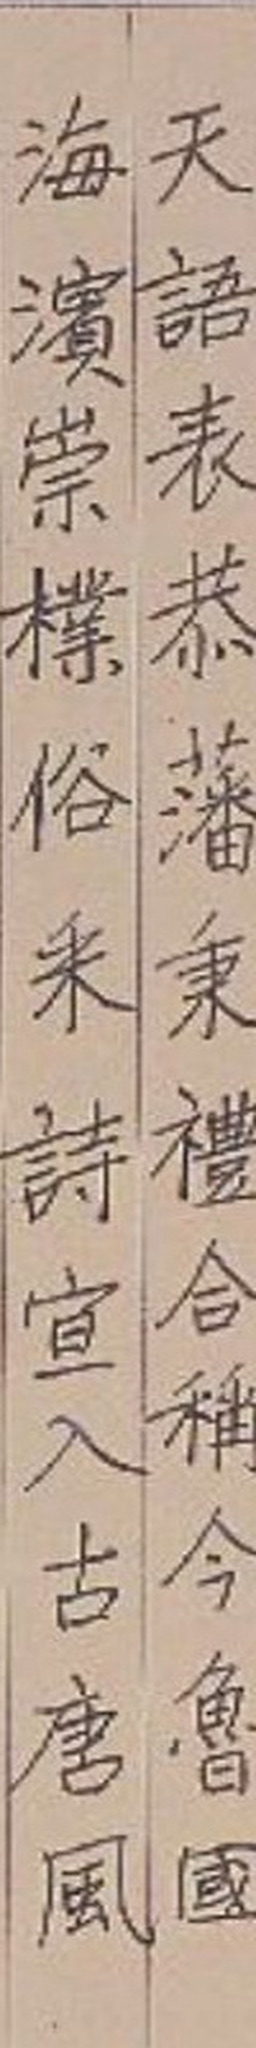海浜崇欉俗采詩宜入古唐風
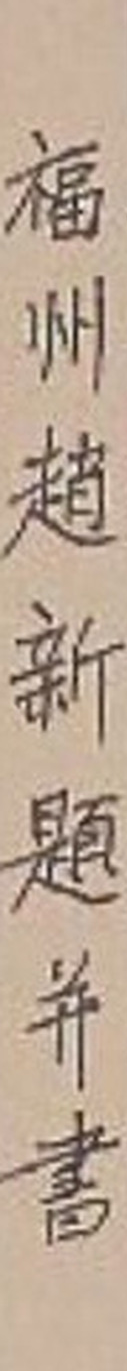福州趙新題并書
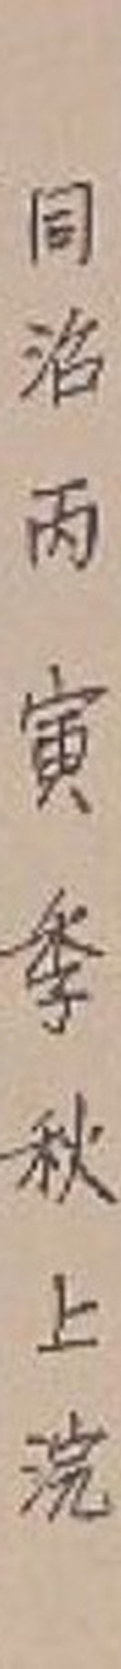同治丙寅季秋上浣
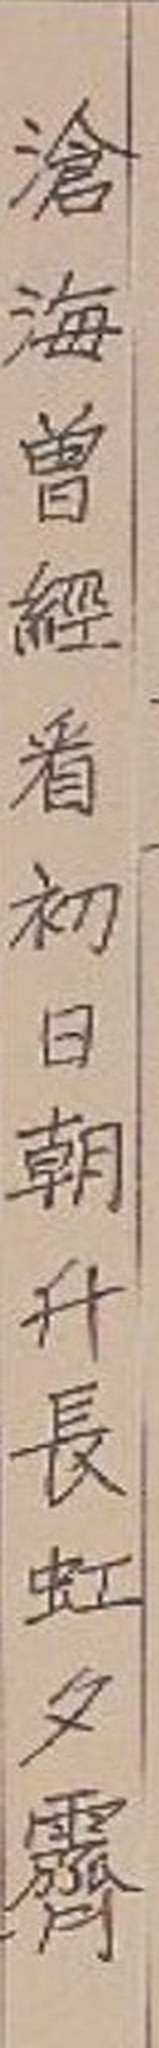滄海曽経看初日朝升長虹有霽
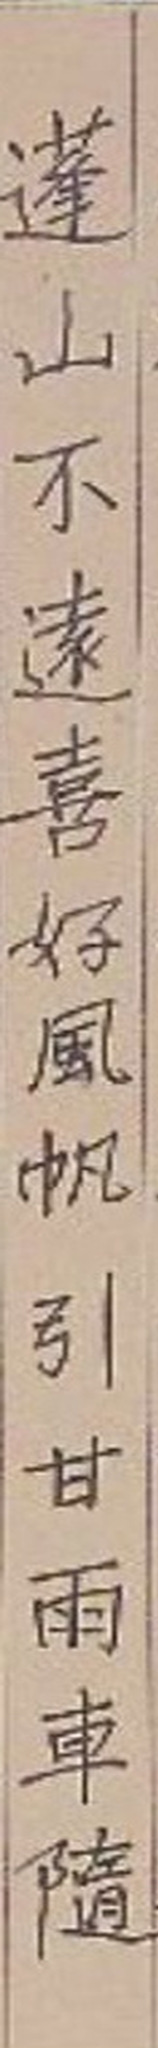蓬山不遠喜好風帆引甘雨車随
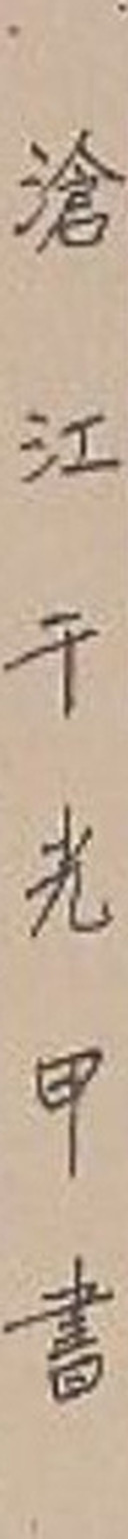滄江干光甲書
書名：支那冊封使来琉諸記 下巻
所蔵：University of the Ryukyus Library
